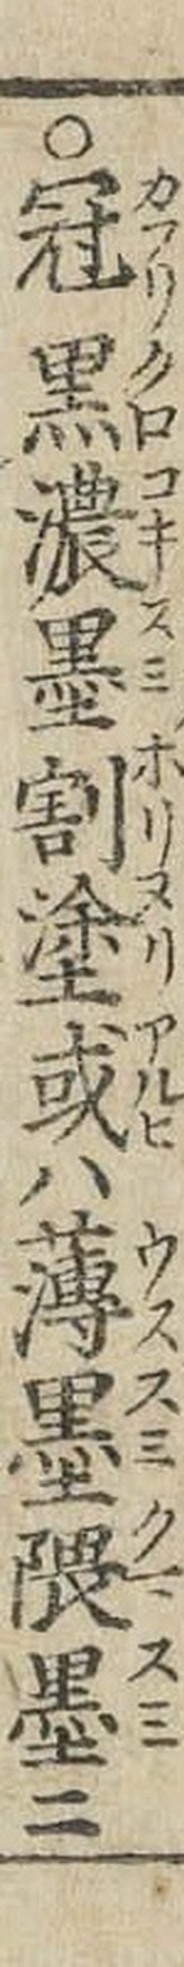○冠黒濃墨割塗或ハ薄墨隈墨ニ
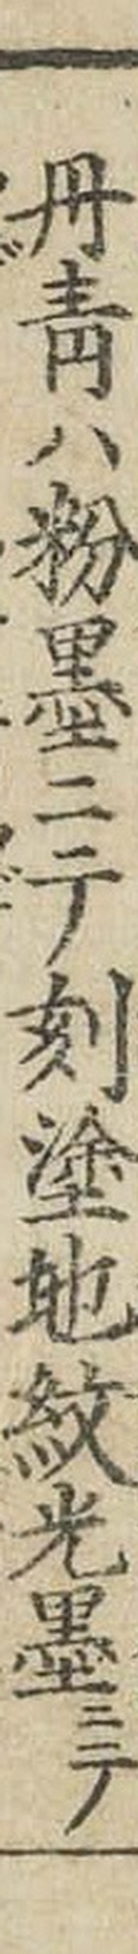丹青ハ粉墨ニテ刻塗地紋光墨ニテ
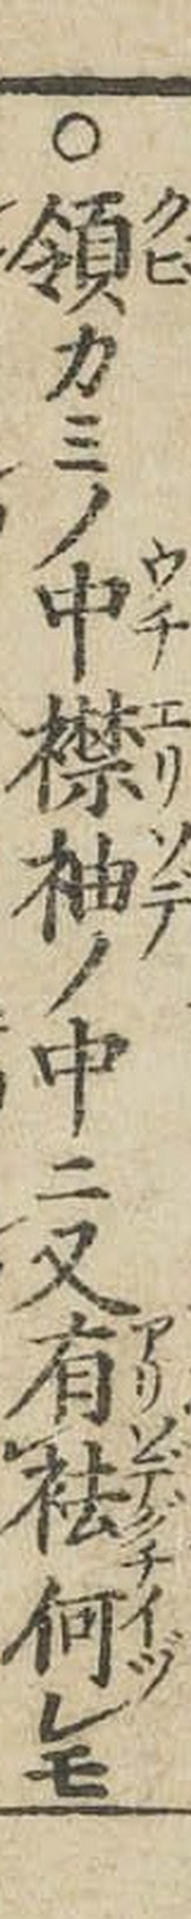○領カミノ中襟袖ノ中ニ又有袪何レモ
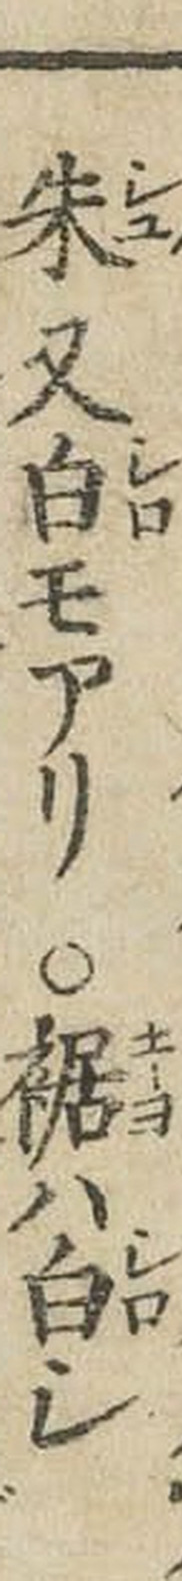朱又白モアリ○裾ハ白シ
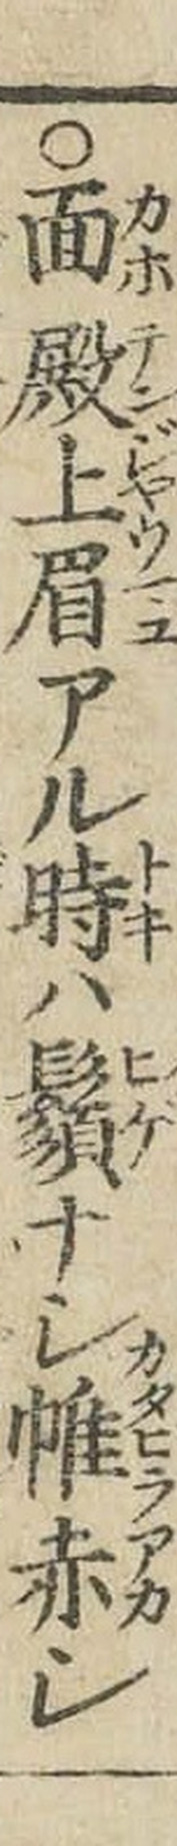○面殿上眉アル時ハ鬚ナシ帷赤シ
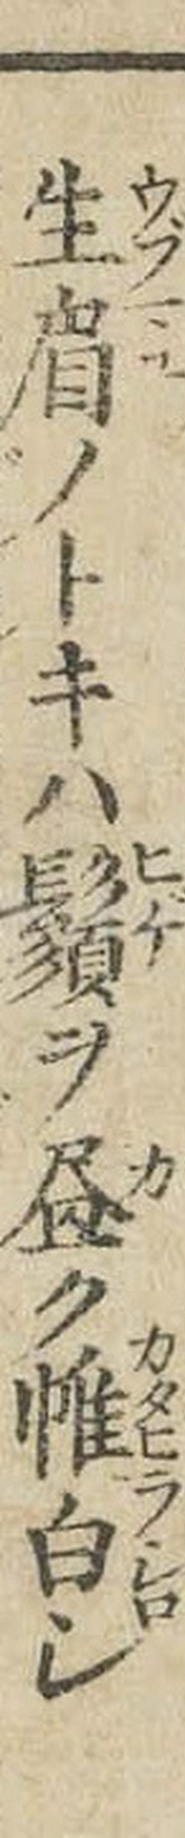生眉ノトキハ鬚ヲ画ク帷白シ
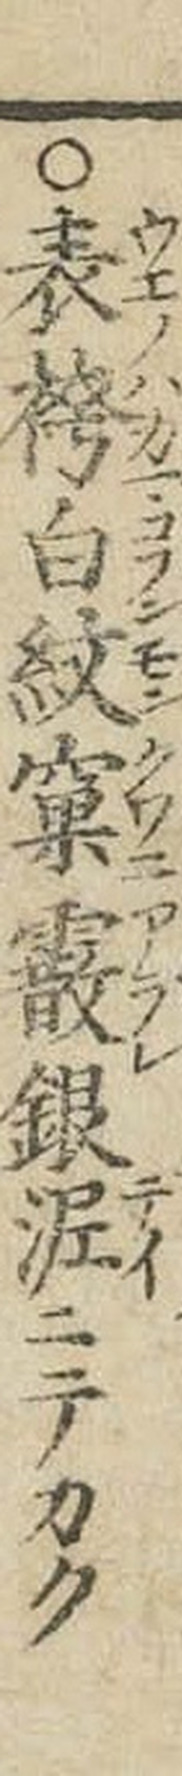○表袴白紋窠霰銀泥ニテカク
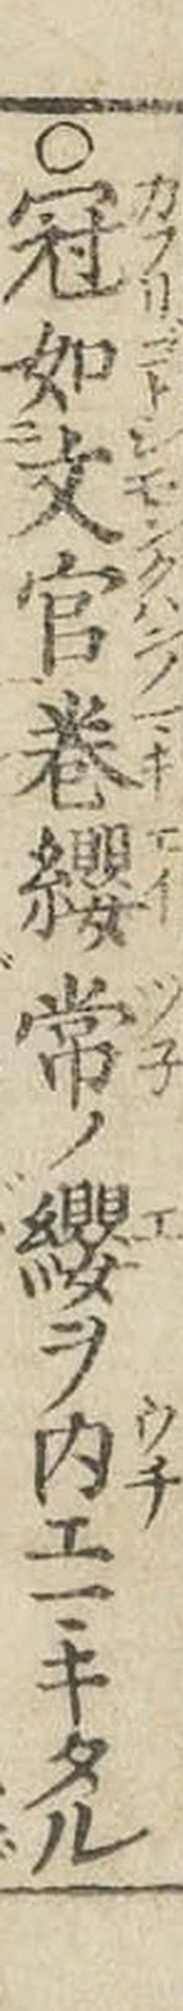○冠如文官巻纓常ノ纓ヲ内エマキタル
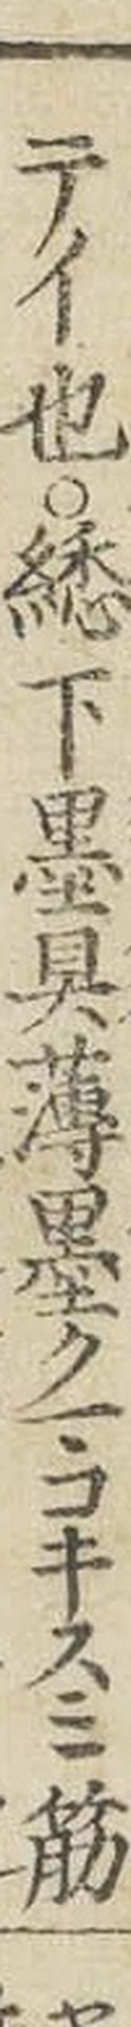テイ也○緌下墨具薄墨クマコキスミ筋
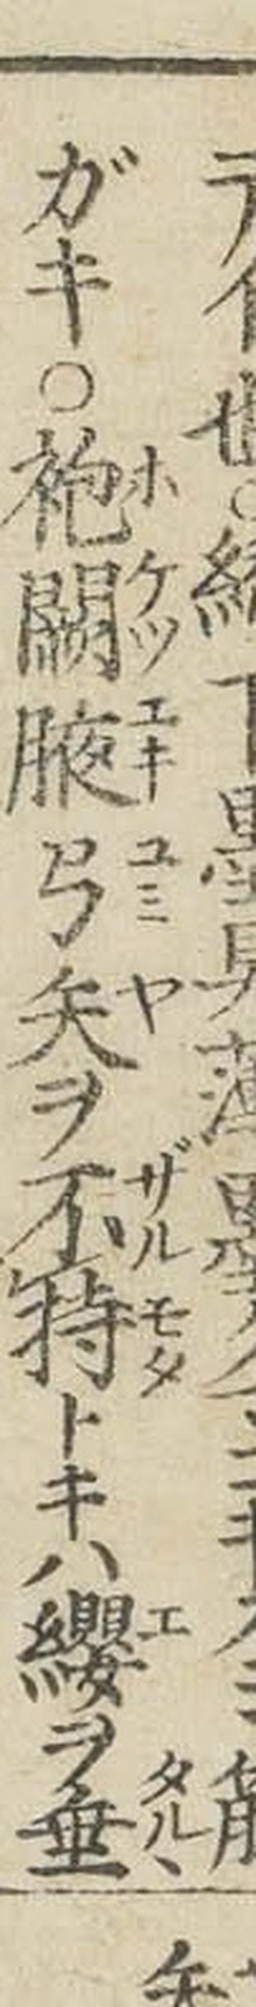ガキ○袍闕腋弓矢ヲ不持トキハ纓ヲ垂
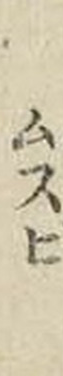ムスビ
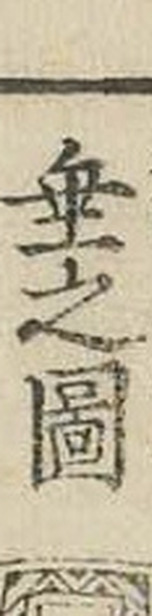垂之図
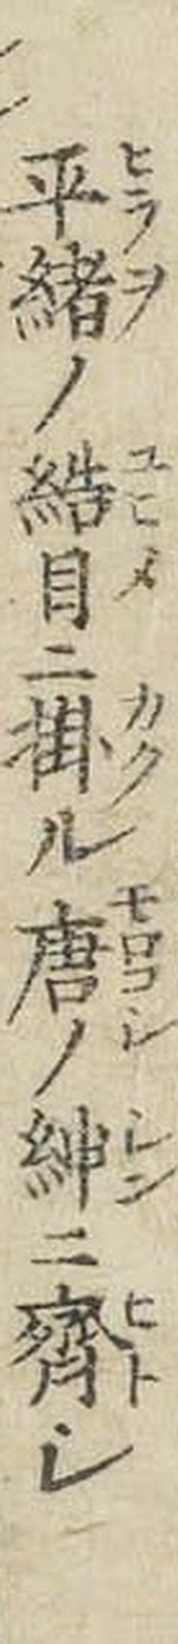平緒ノ結目ニ掛ル唐ノ紳ニ齊シ
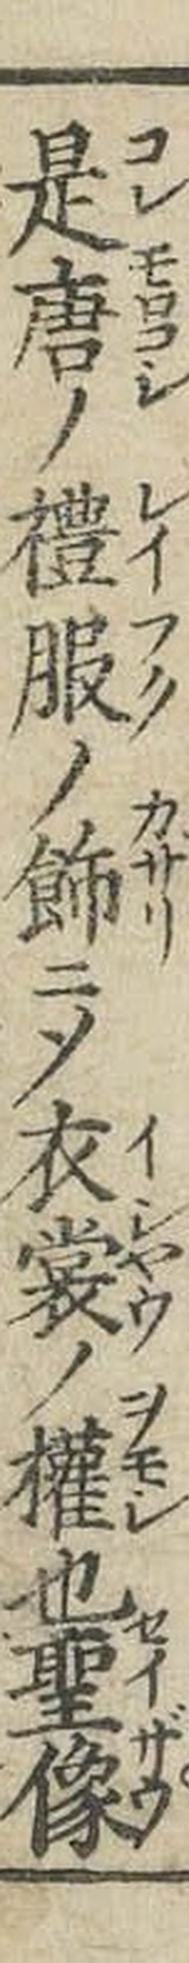是唐ノ礼服ノ飾ニシテ衣裳ノ権也聖像
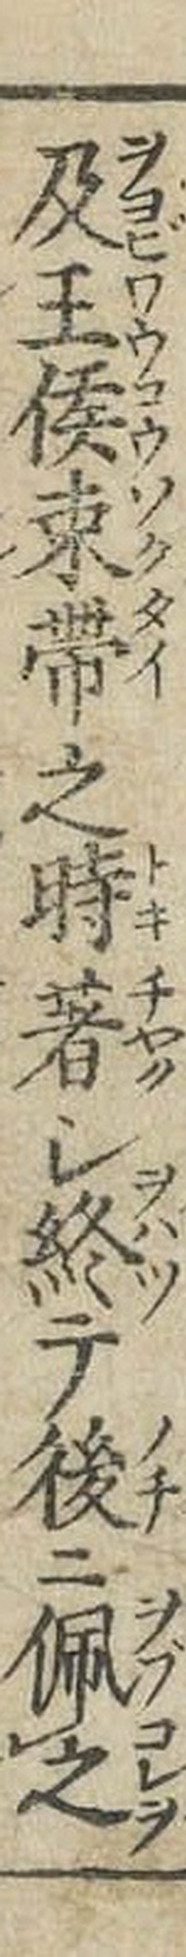及王侯束帯之時著シ終テ後ニ佩之
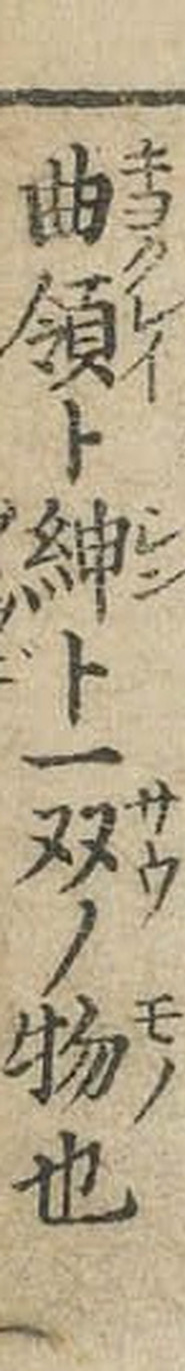曲領ト紳ト一双ノ物也
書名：絵本写宝袋 9巻 1之巻
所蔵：東京学芸大学教育コンテンツアーカイブ
